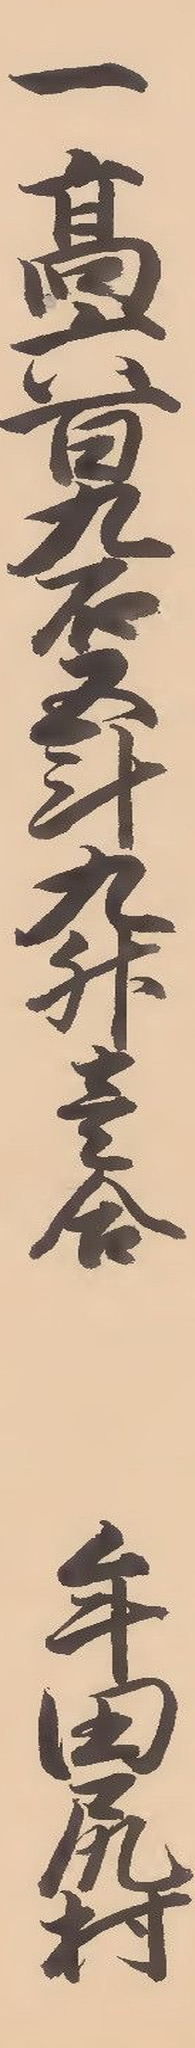一高六百九石五斗九升壱合牟田尻村
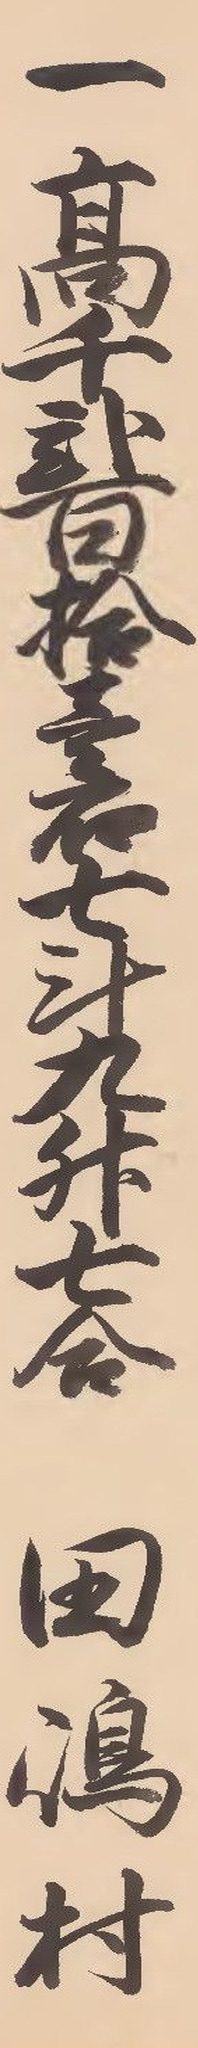一高千弐百拾壱石七斗九升七合田島村
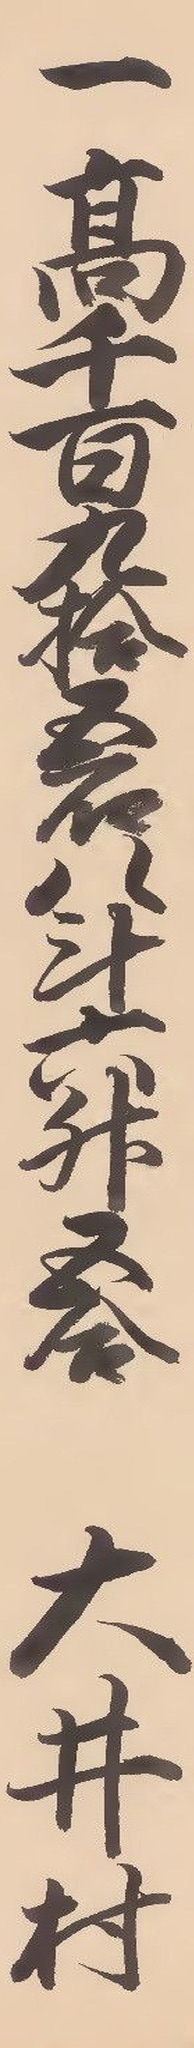一高千百九拾五石八斗六升五合大井村
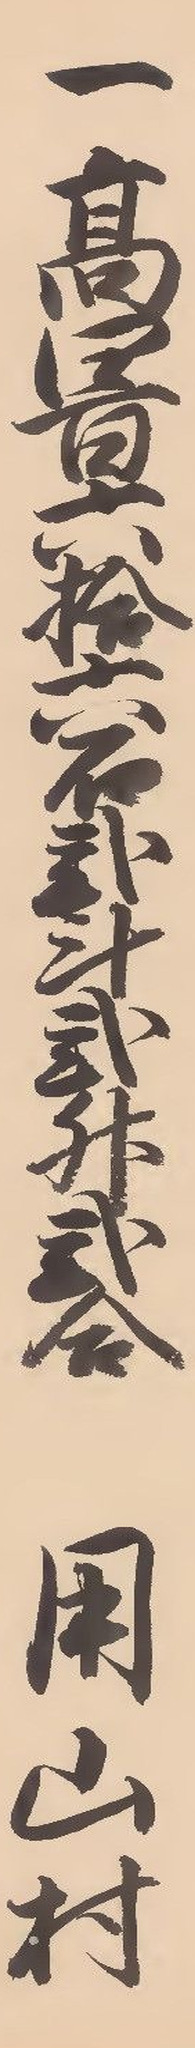一高四百六拾六石弐斗弐升弐合用山村

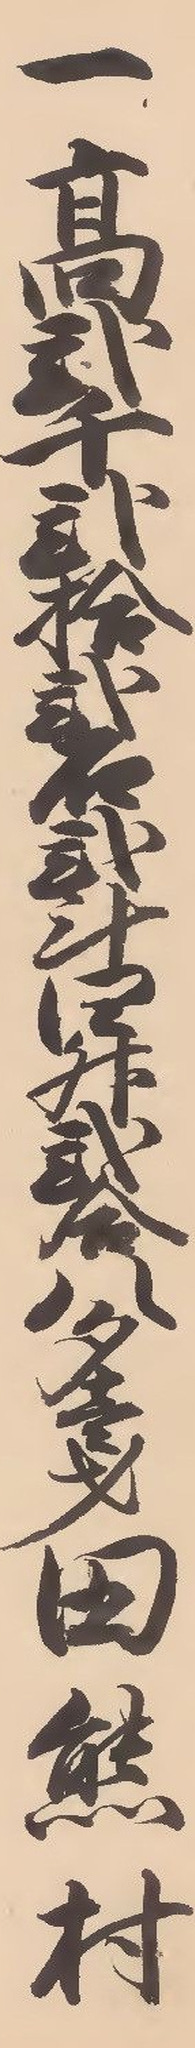一高弐千弐拾弐石弐斗四升弐合八勺壱才田熊村
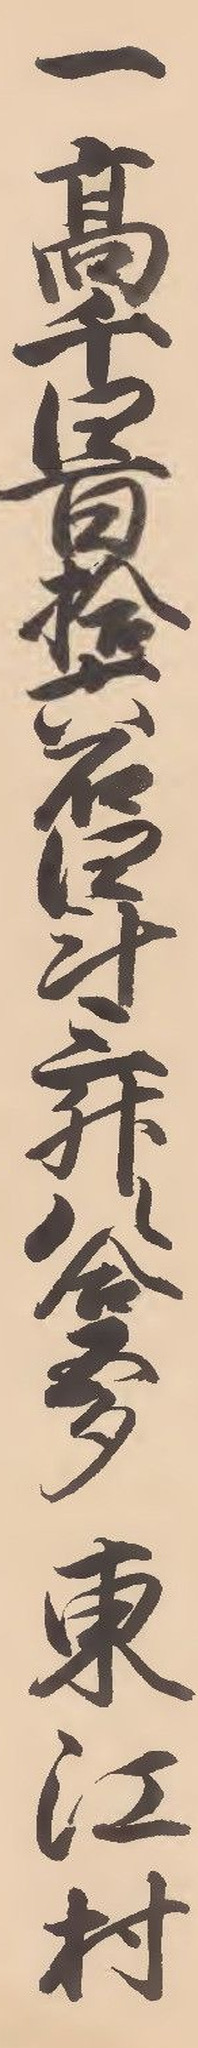一高千四百拾六石四斗三升八合五勺東江村
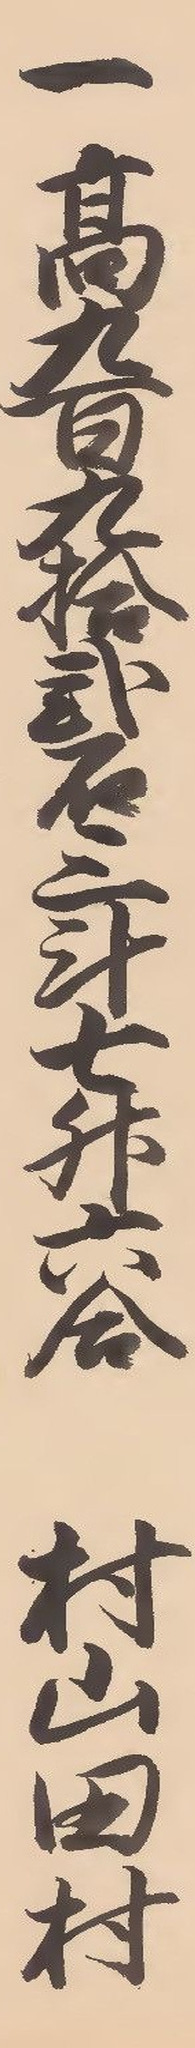一高九百九拾弐石三斗七升六合村山田村
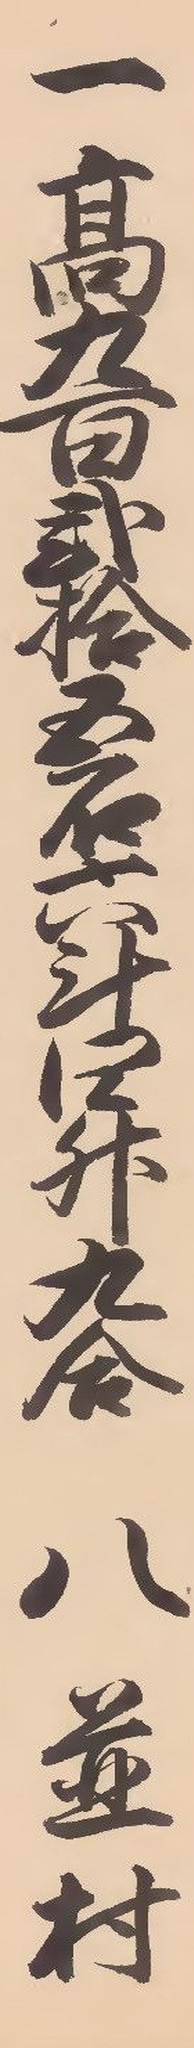一高九百弐拾五石六斗四升九合八並村
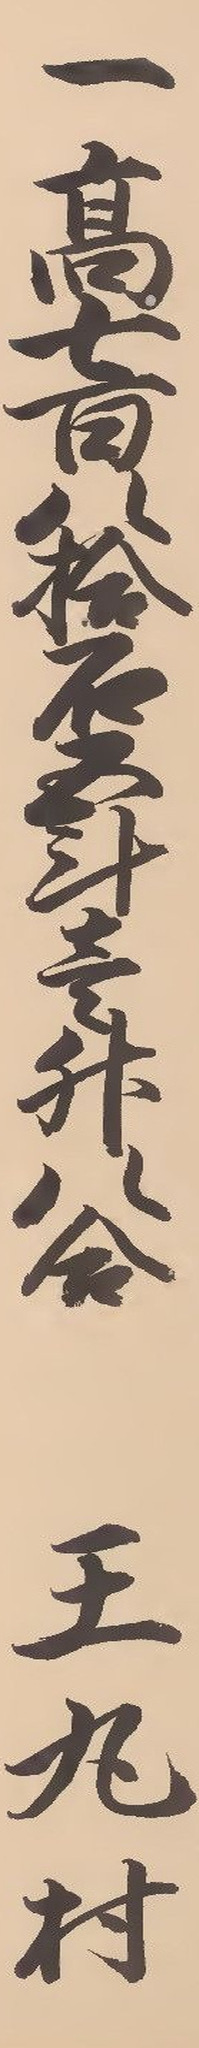一高七百八拾石五斗壱升八合王丸村
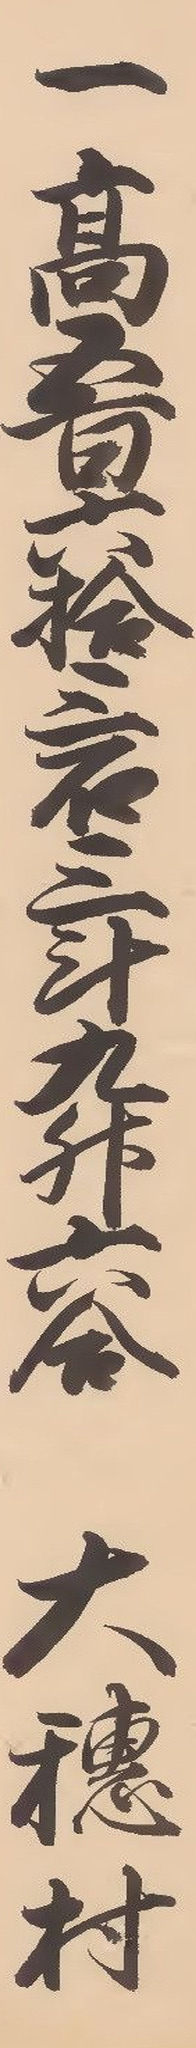一高五百六拾三石三斗九升六合大穂村

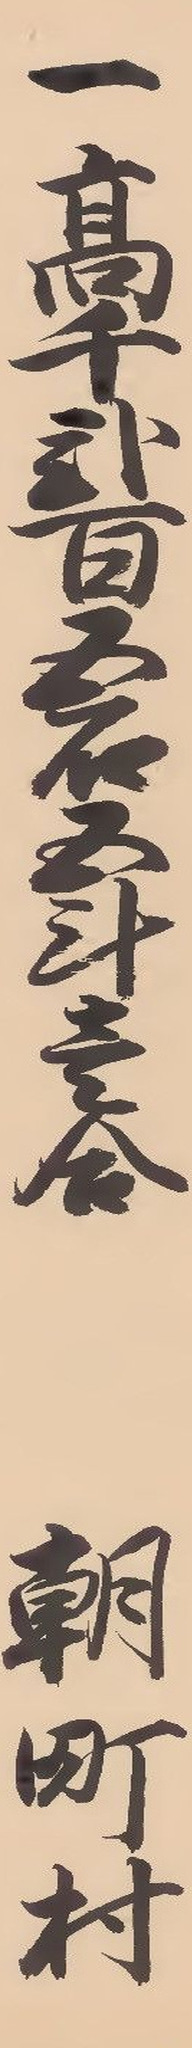一高千弐百五石五斗壱合朝町村
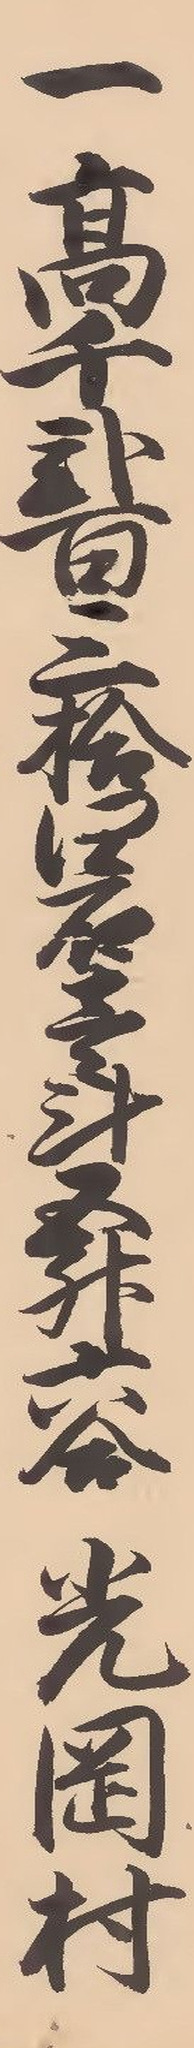一高千弐百三拾四石壱斗五升六合光岡村
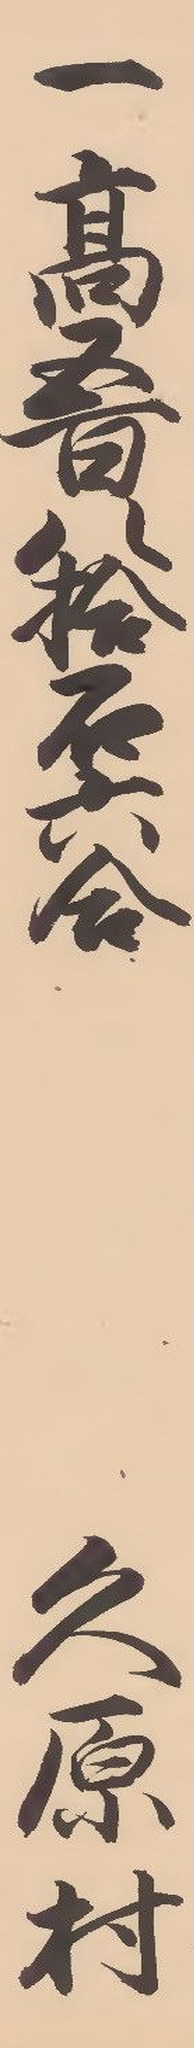一高五百八拾石六合久原村
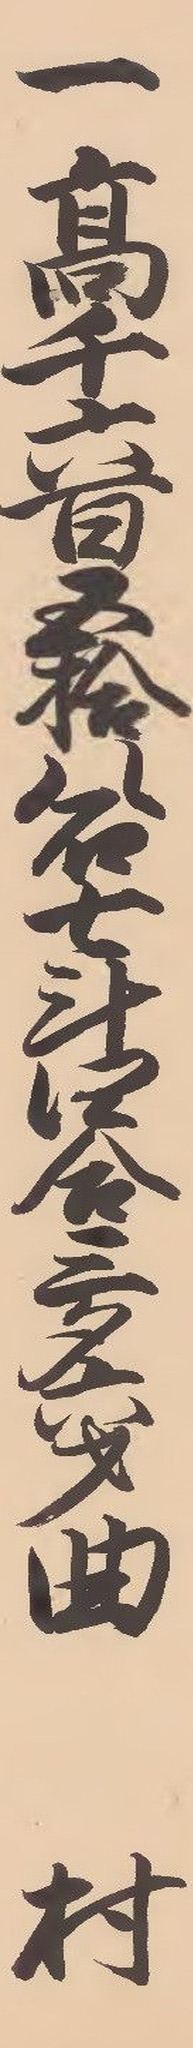一高千六百五拾八石七斗四合三勺六才曲村
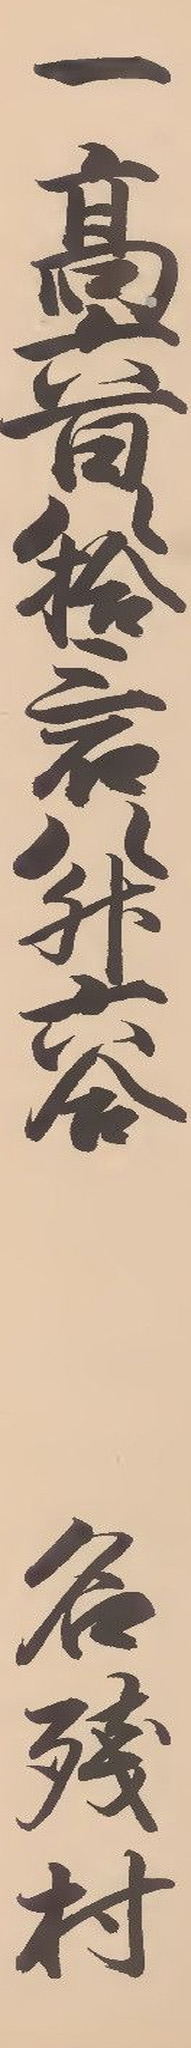一高六百八拾三石八升六合名残村
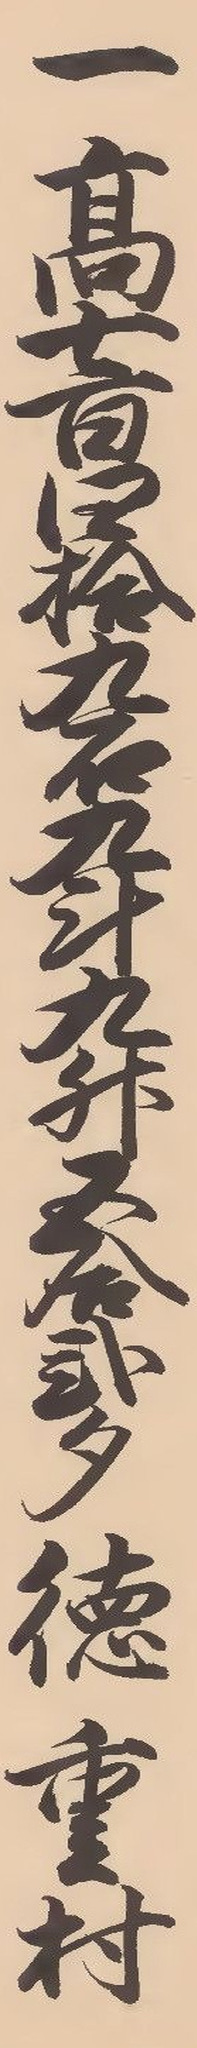一高七百四拾九石九斗九升五合弐勺徳重村
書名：筑前国郷帳
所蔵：国立公文書館 National Archives of Japan
